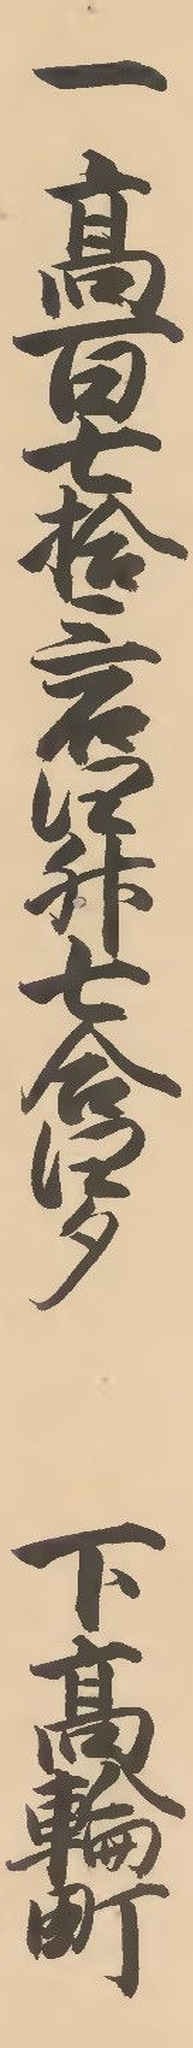一高百七拾三石四升七合四勺下高輪町

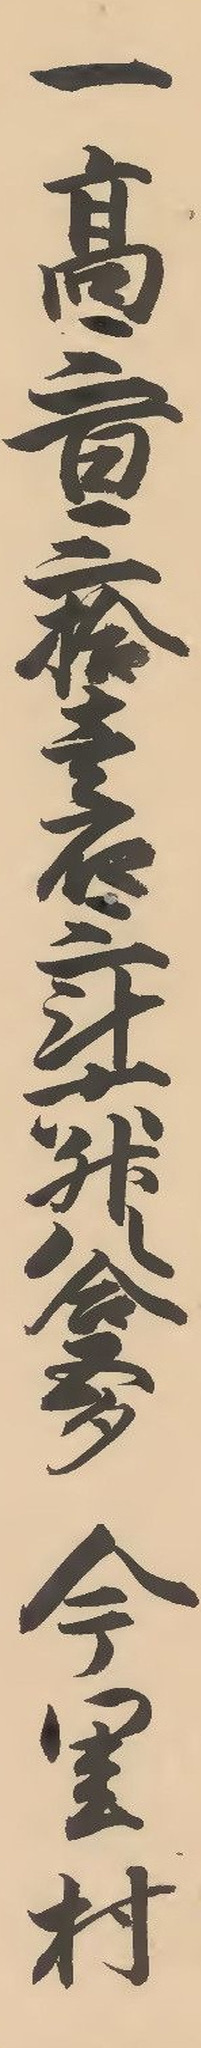一高三百三拾壱石三斗六升八合五勺今里村
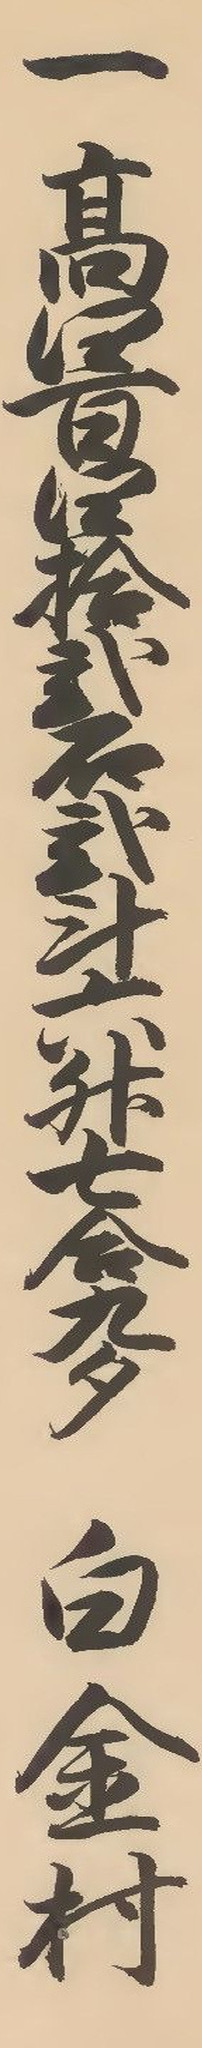一高四百四拾弐石弐斗六升七合九勺白金村
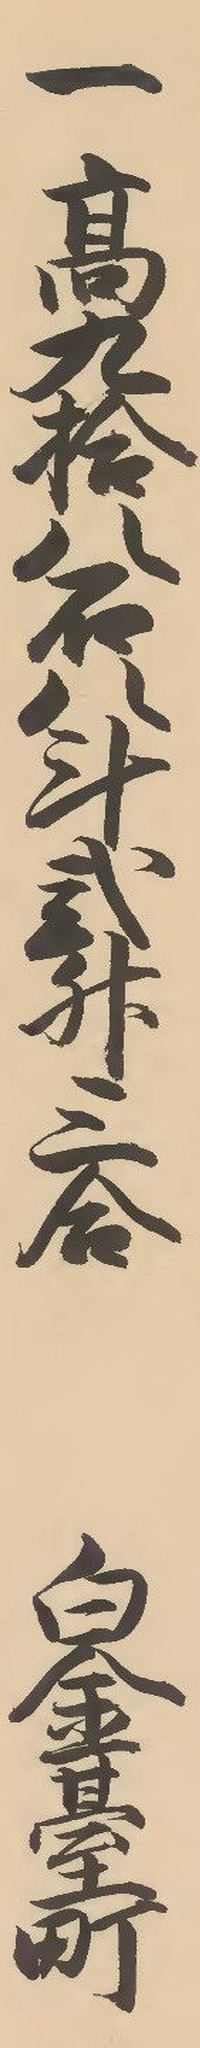一高九拾八石八斗弐升三合白金台町
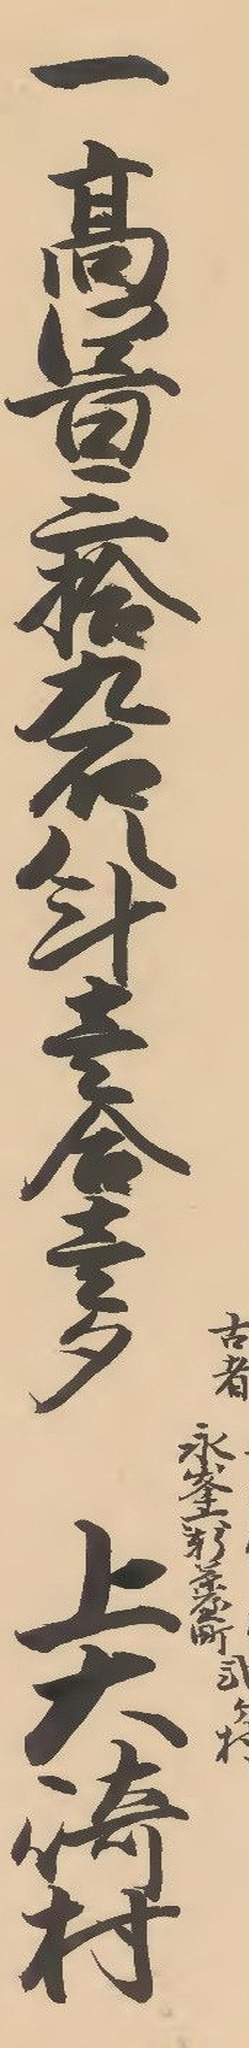一高四百三拾九石八斗壱合壱勺上大崎村
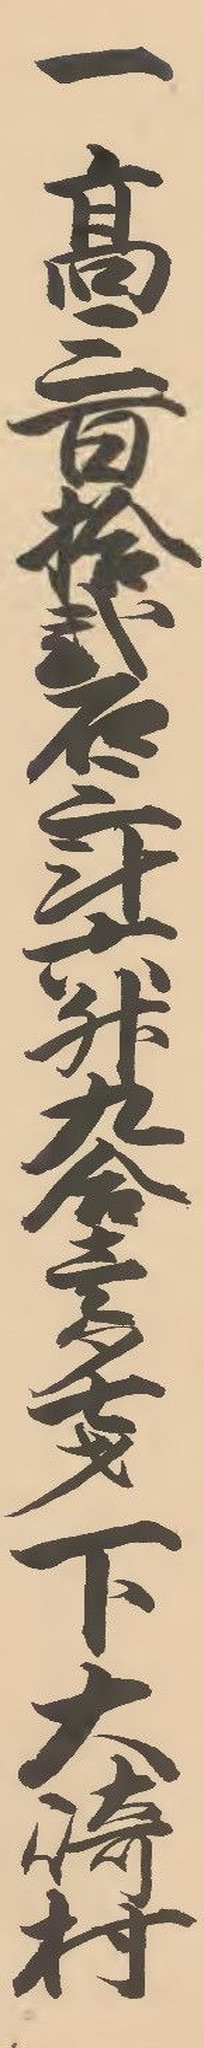一高三百拾弐石三斗六升九合壱勺七才下大崎村
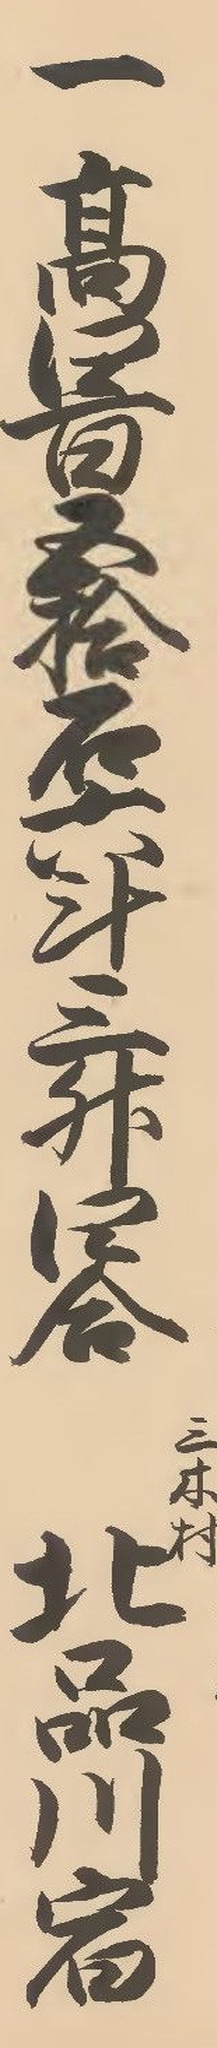一高四百五拾石六斗三升四合北品川宿
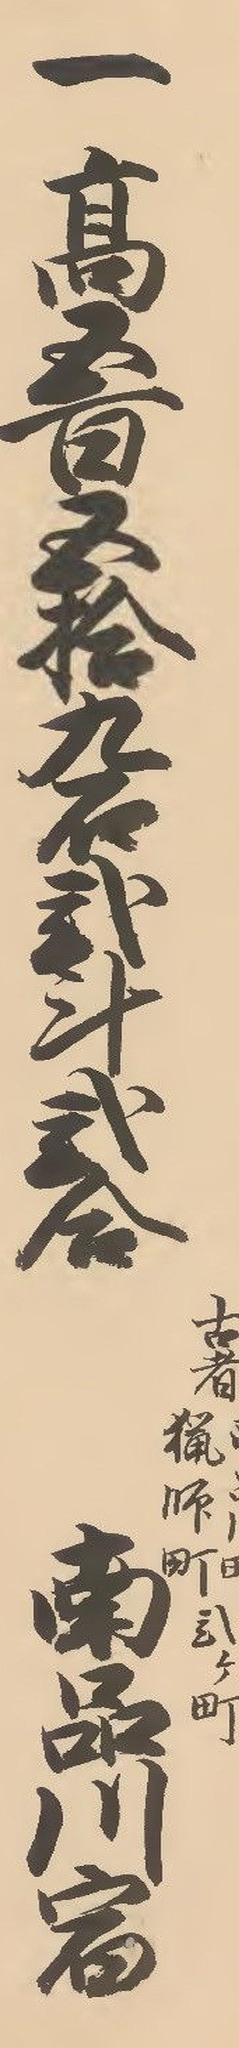一高五百五拾九石弐斗弐合南品川宿
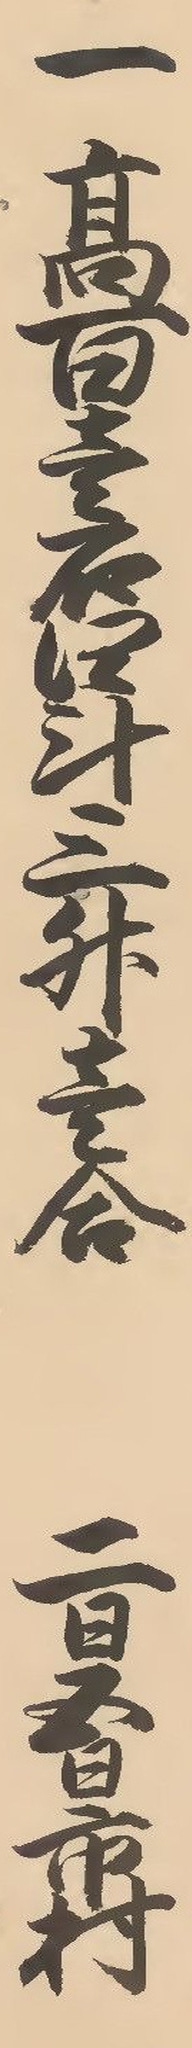一高百壱石四斗三升壱合二日五日市村

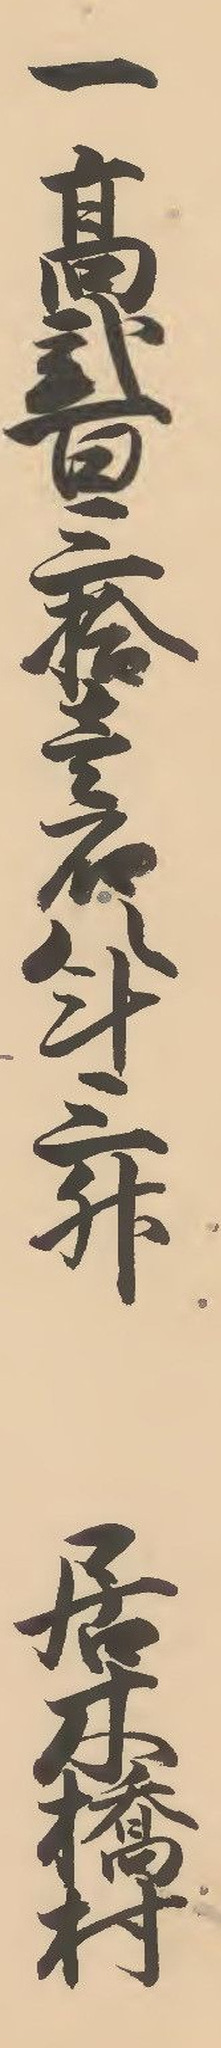一高弐百三拾壱石八斗三升居木橋村
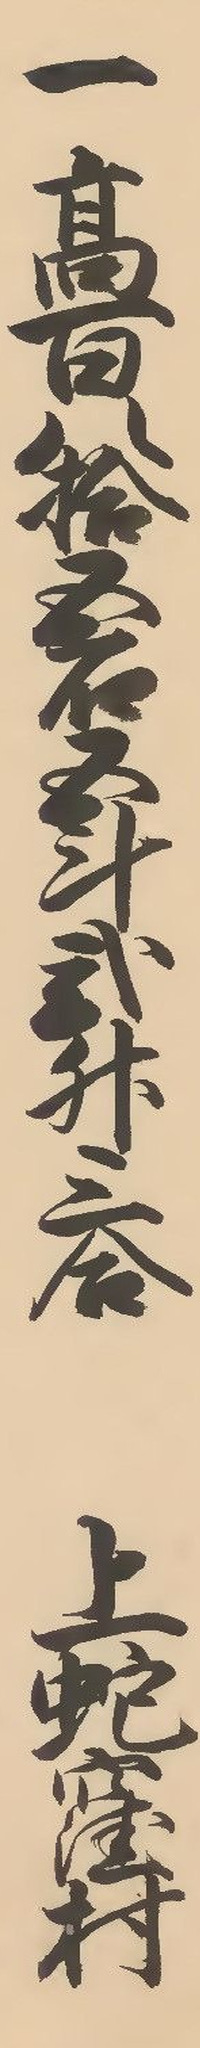一高百八十五石五斗弐升三合上蛇窪村
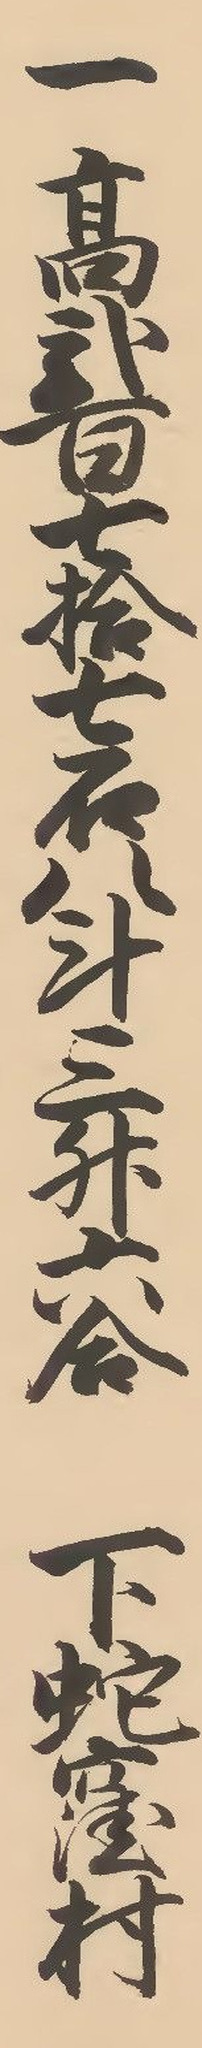一高弐百七拾七石八斗三升六合下蛇窪村
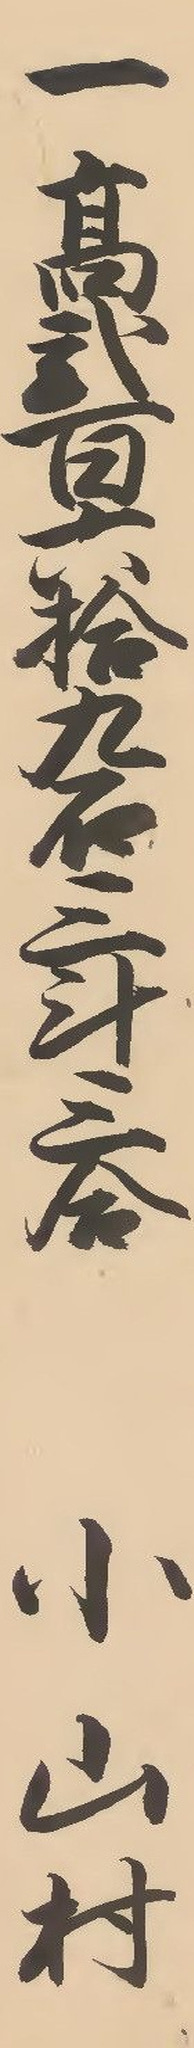一高弐百六拾九石三斗三合小山村
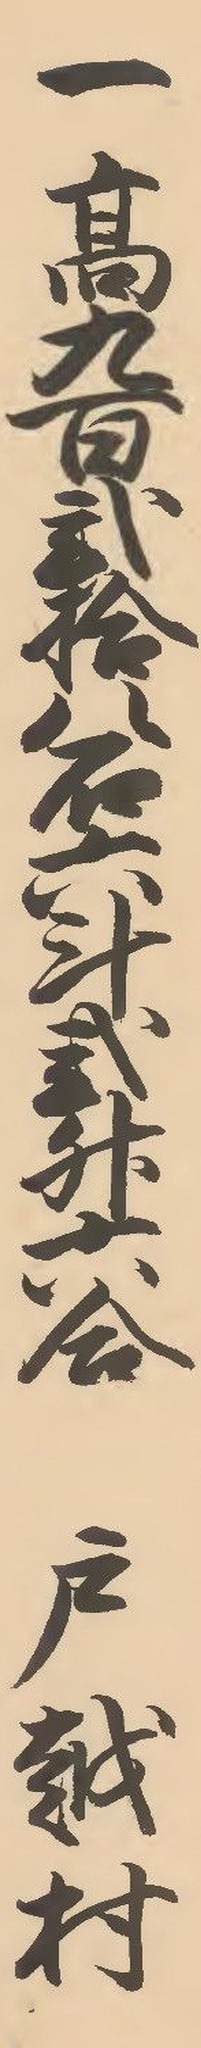一高九百弐拾八石六斗弐升六合戸越村
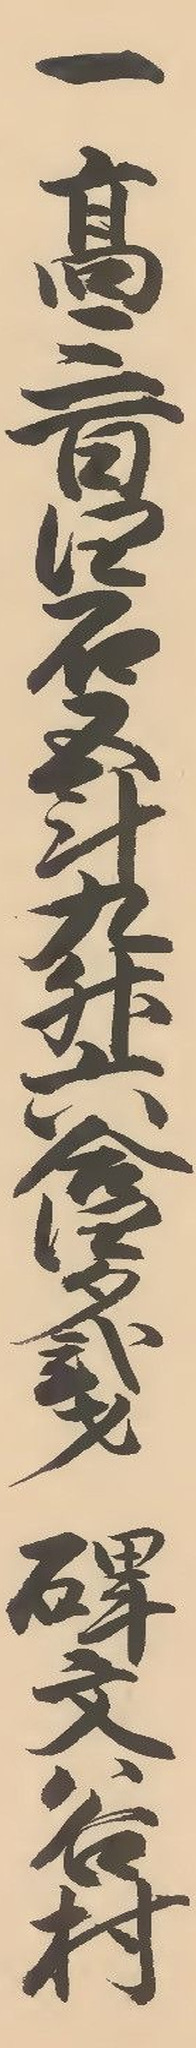一高三百四石五斗九升六合四勺弐才碑文谷村
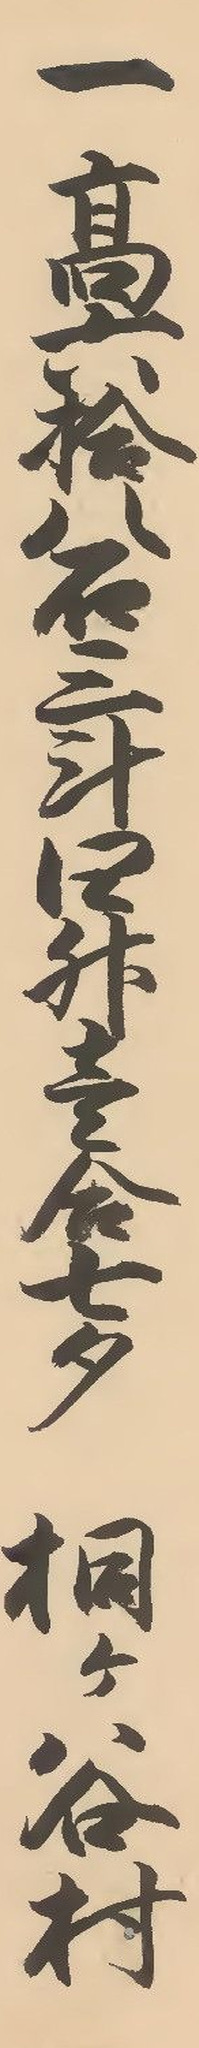一高六拾八石三斗四升壱合七勺桐ヶ谷村
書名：武蔵国郷帳　上
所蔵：国立公文書館 National Archives of Japan
